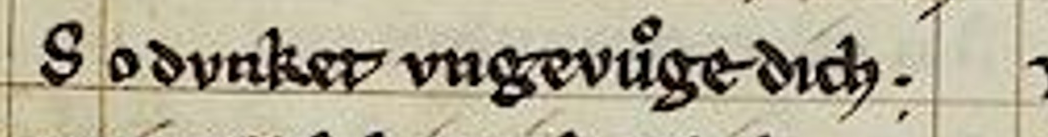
So dvnket vngevu°oge dich.
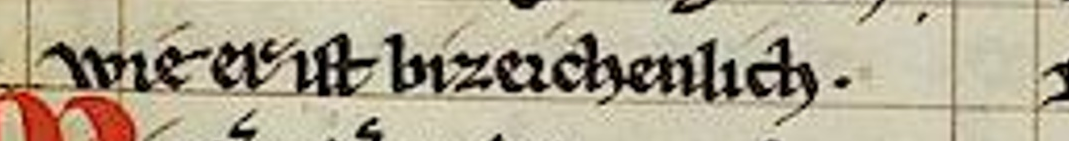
Wie er iſt bizeichenlich.
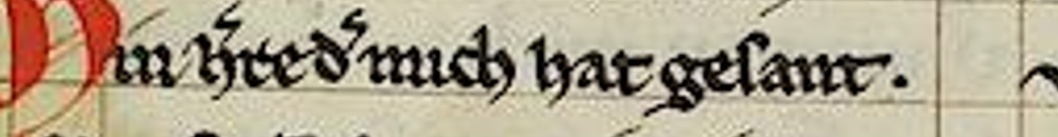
*Min h(er)re d(er) mich hat geſant.
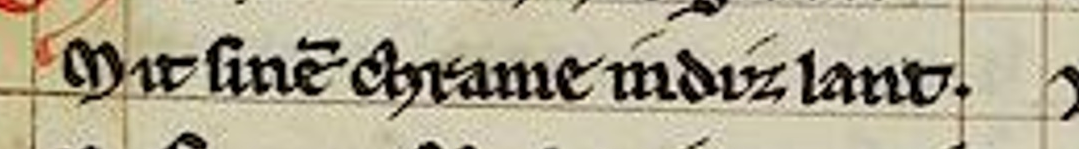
Mit ſine(m) chrame indiz lant.
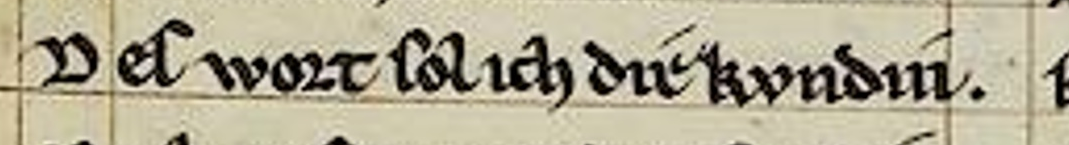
Deſ wort ſol ich dir kvndin.
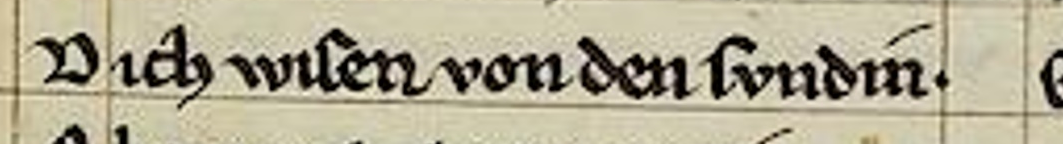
Dich wiſen von den ſvndin.
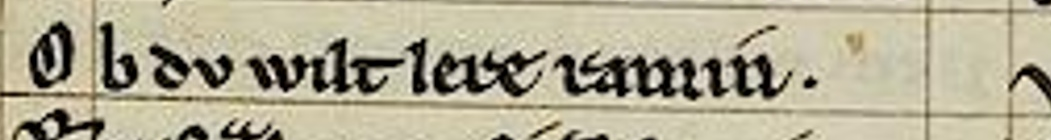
Ob dv wilt lere ramin.
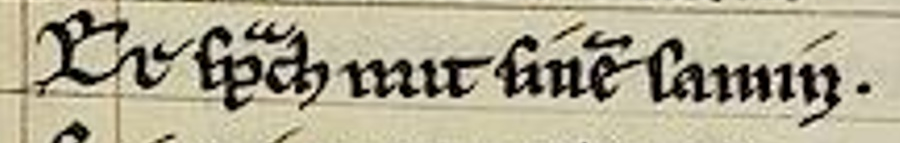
Er ſp(ra)ch mit ſine(m) ſamin.
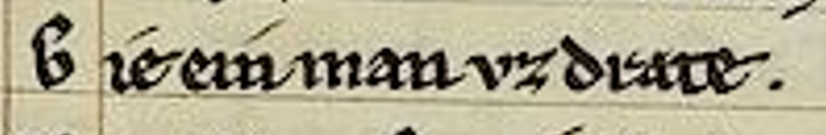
Gie ein man vz drate.
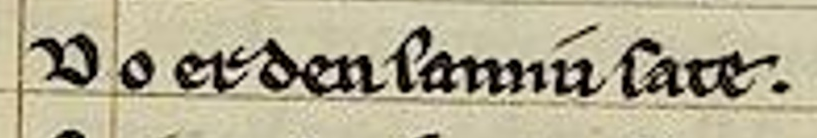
Do er den ſamin ſate.
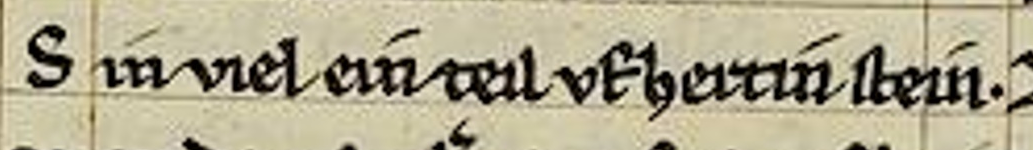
Sin viel ein teil vf hertin ſtein.
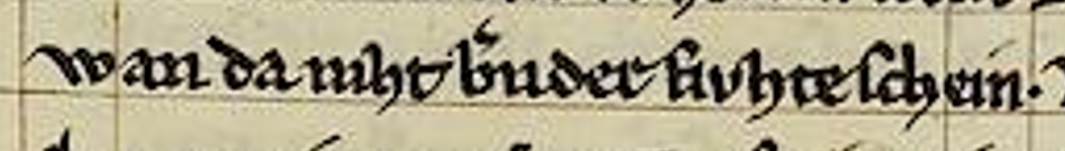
Wan da niht b(er)nder fivhte ſchein.
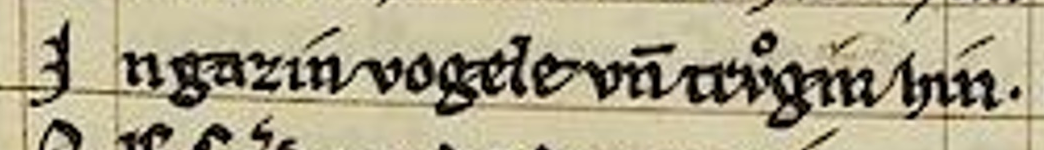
In gazin vogele vn(d) trv°ogin hin.
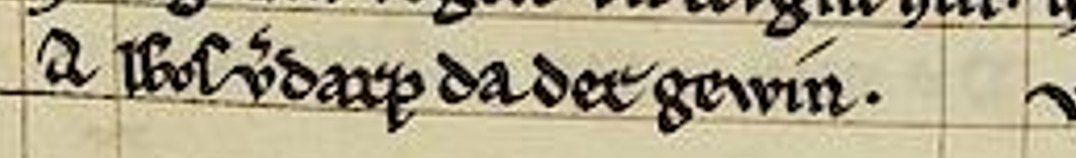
Alſvſ v(er)darp da der gewin.
